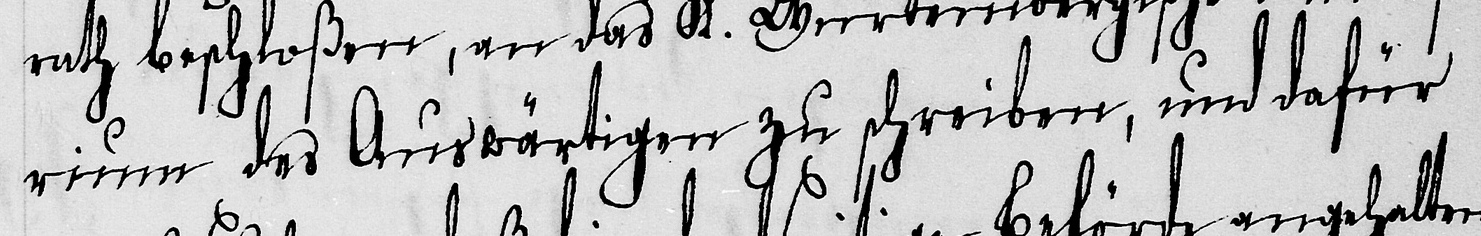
rium des Auswärtigen zu schreiben, und dafür
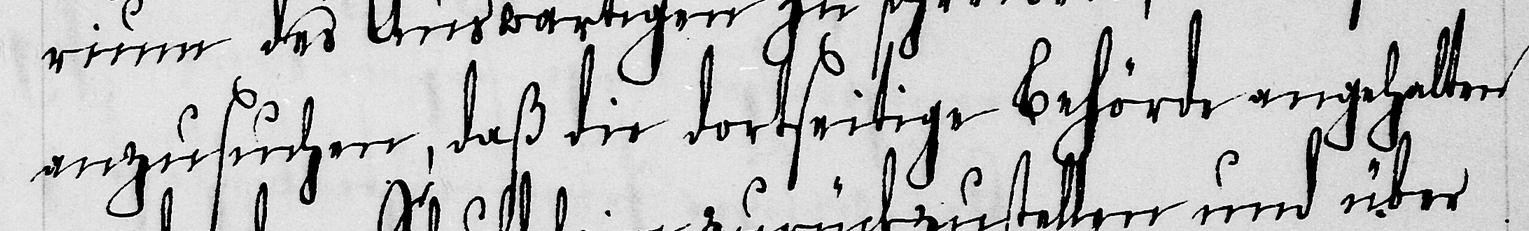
anzusuchen, daß die dortseitige Behörde angehalten
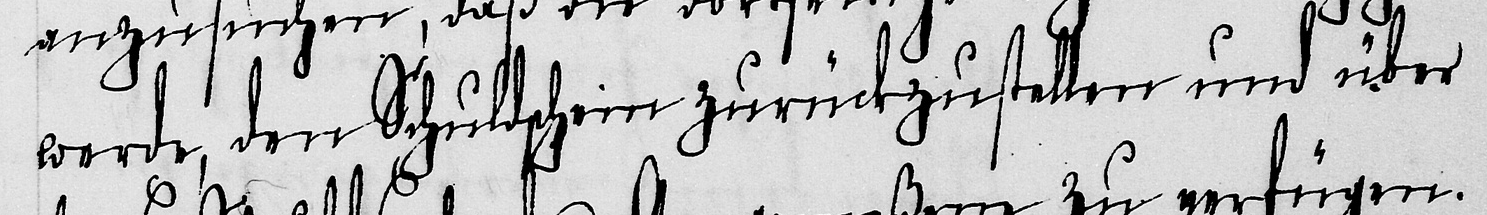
werde, den Schuldschein zurückzustellen und über
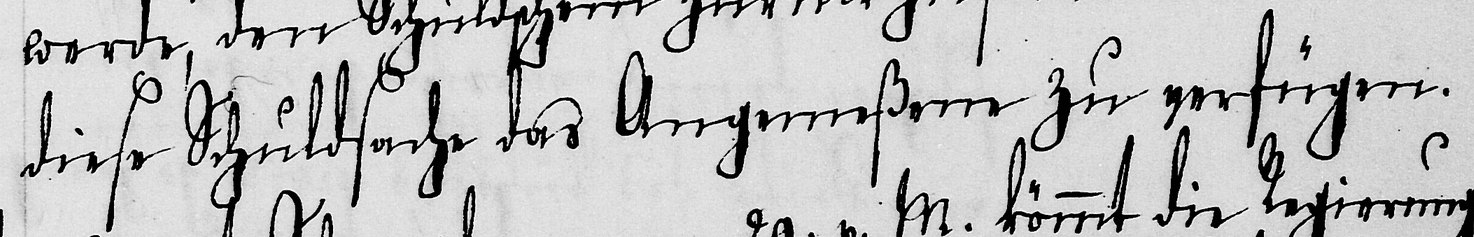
diese Schuldsache das Angemeßene zu verfügen.
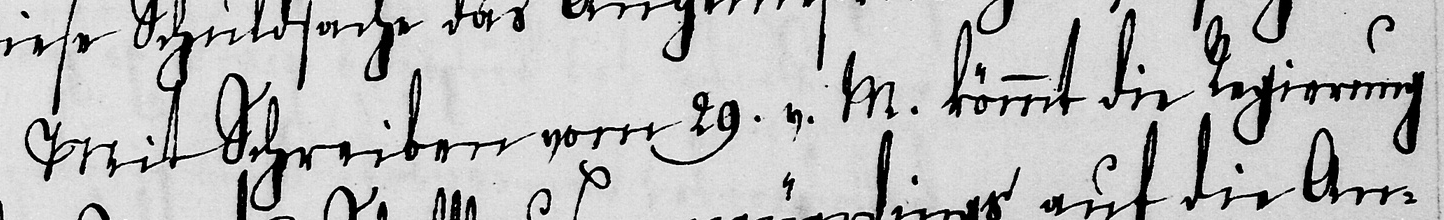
Mit Schreiben vom 29. v. M. kömmt die Regierung
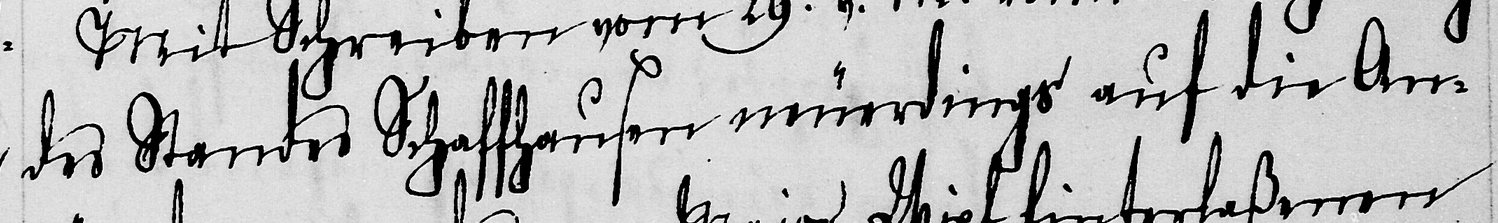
des Standes Schaffhausen neuerdings auf die An¬
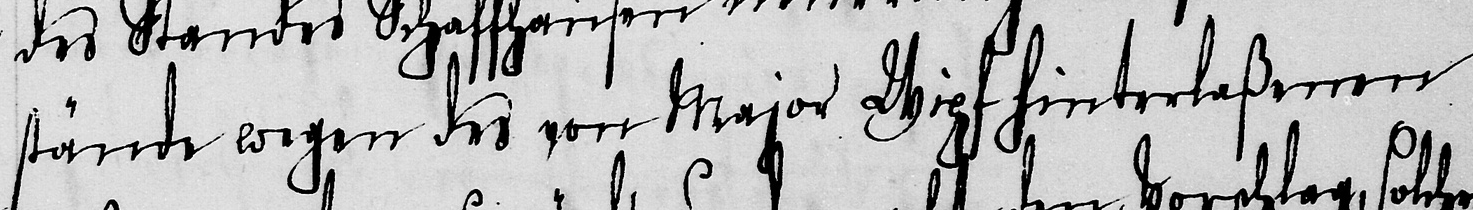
stände wegen des von Major Wipf hinterlaßenen
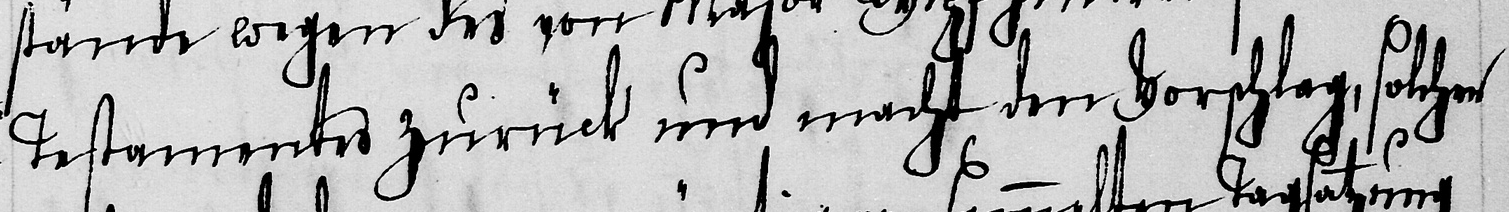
Testamentes zurück und macht den Vorschlag, solch¬
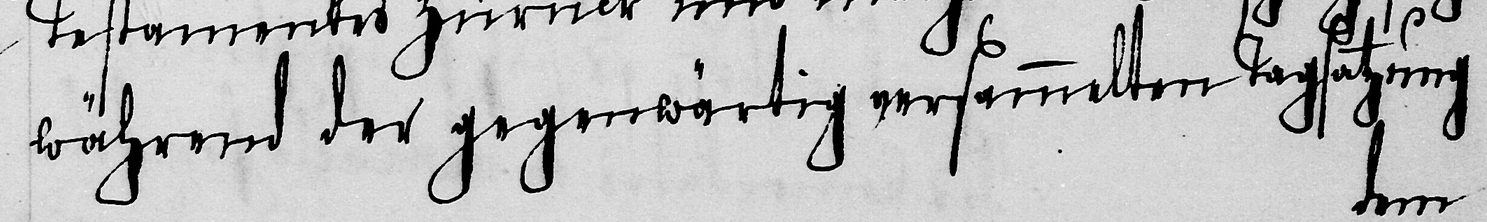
während der gegenwärtig versammelten Tagsatzung
